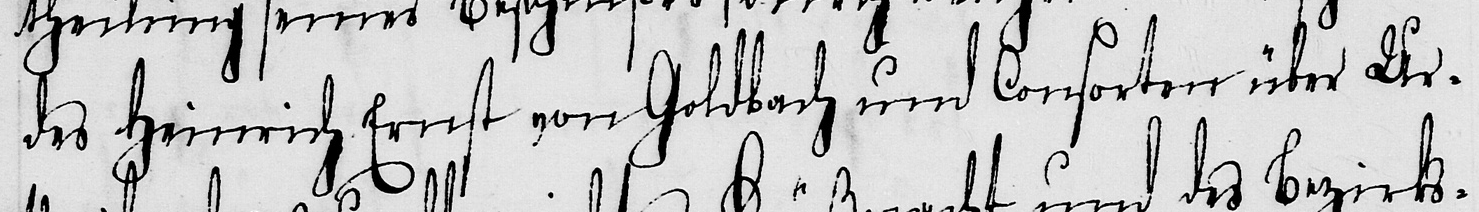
des Heinrich Ernst von Goldbach und Consorten über Ur¬
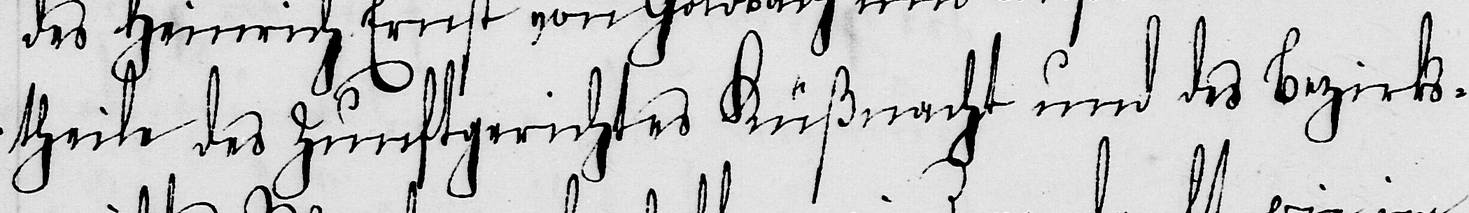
theile des Zunftgerichtes Küßnacht und des Bezirks¬
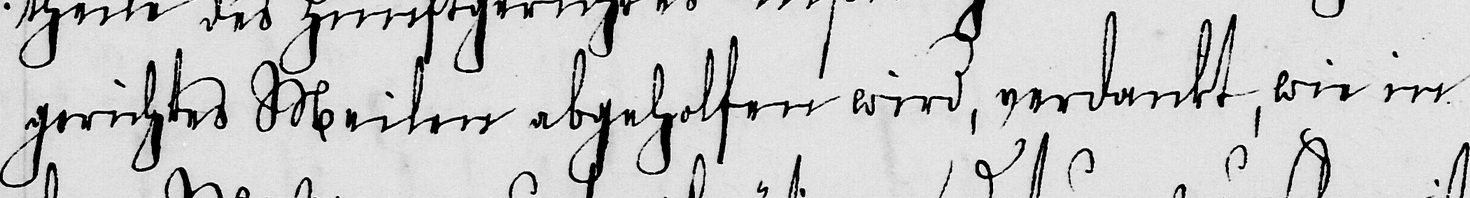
gerichtes Meilen abgeholfen wird, verdankt, wie in
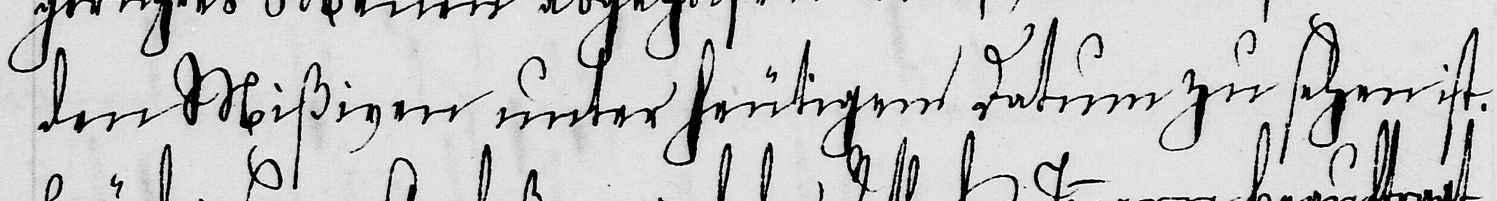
den Mißiven unter heutigem Datum zu sehen ist.
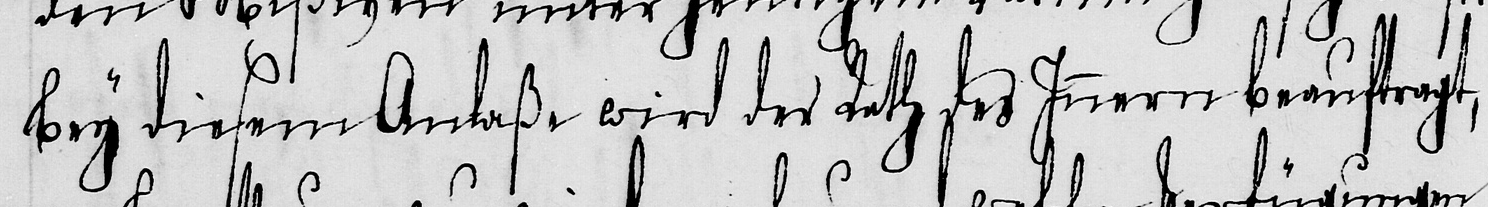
Bey diesem Anlaße wird der Rath des Innern beauftragt,
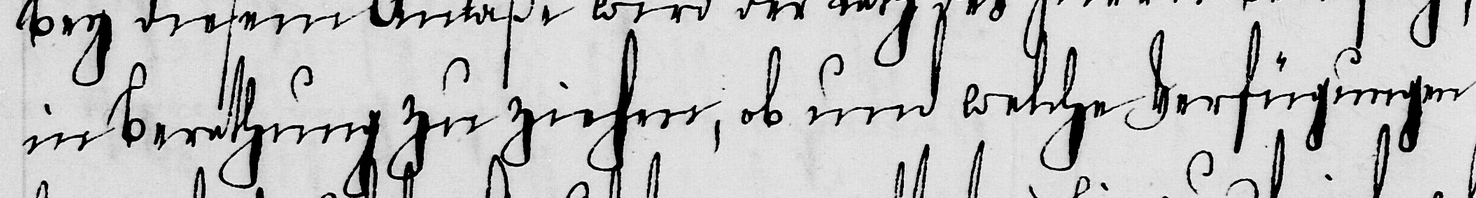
in Berathung zu ziehen, ob und welche Verfügungen
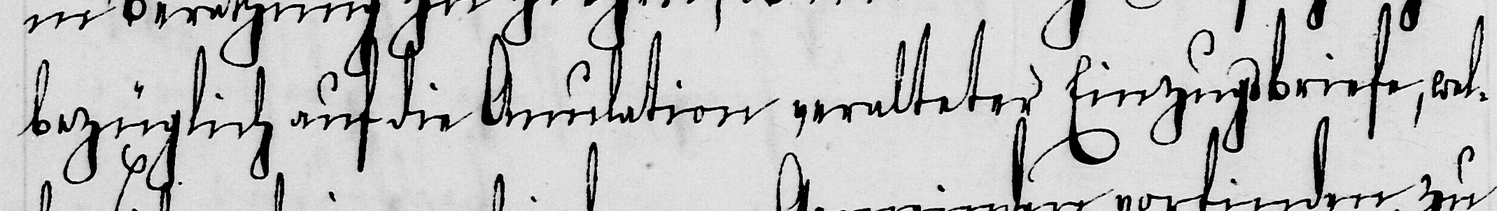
bezüglich auf die Annulation veralteter Einzugsbriefe, we¬
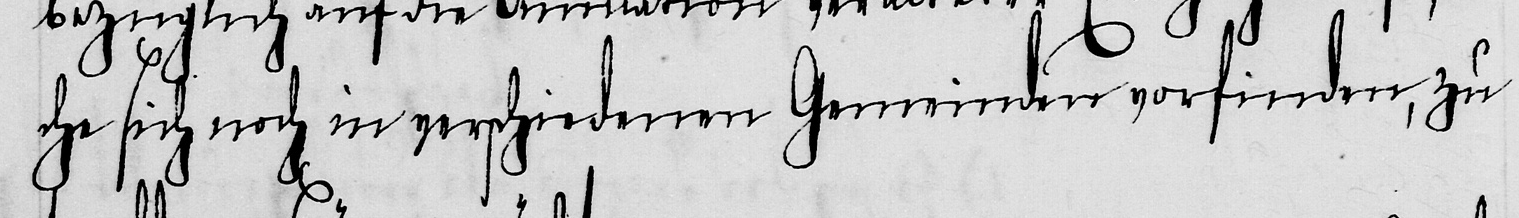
lche sich noch in verschiedenen Gemeinden vorfinden, zu
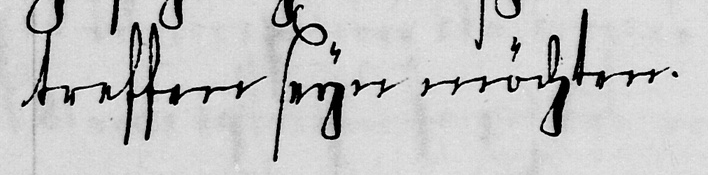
treffen seyn möchten.
